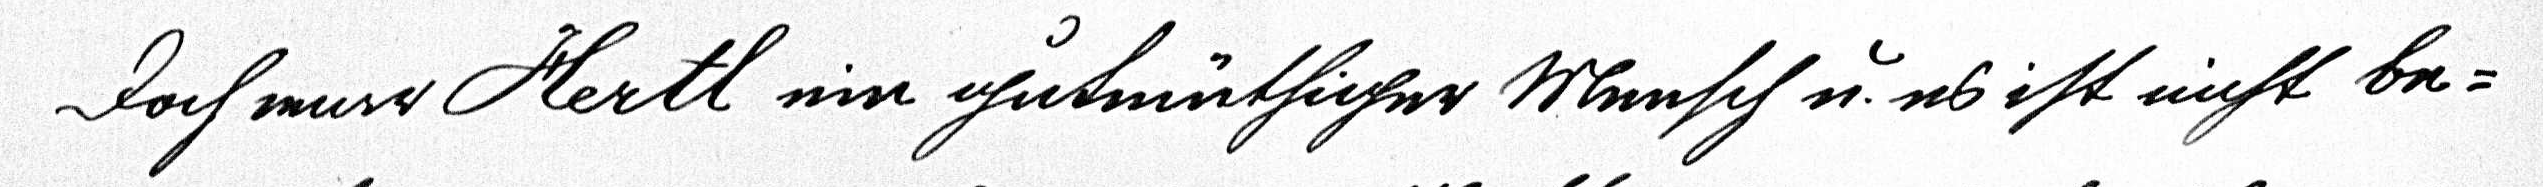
Doch war Hertl ein gutmüthlicher Mensch u. es ist nicht be¬
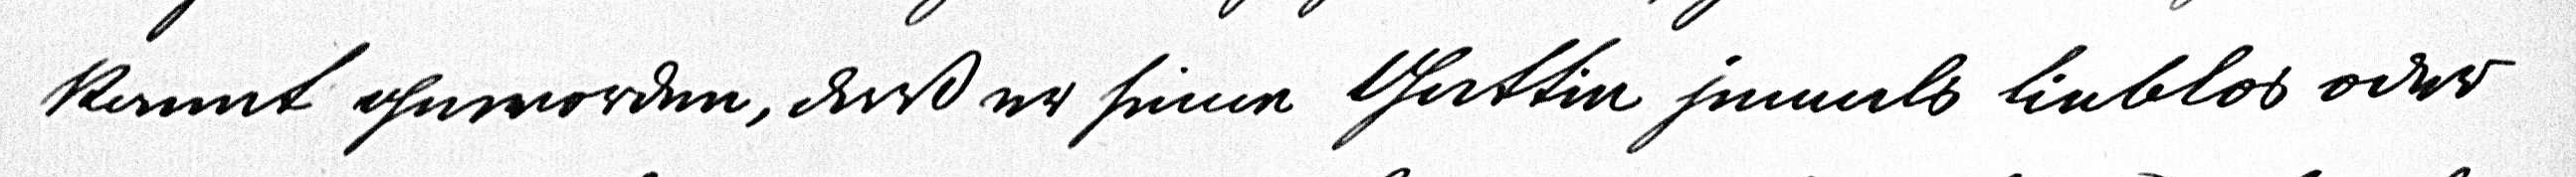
kannt geworden, daß er seine Gattin jemals lieblos oder
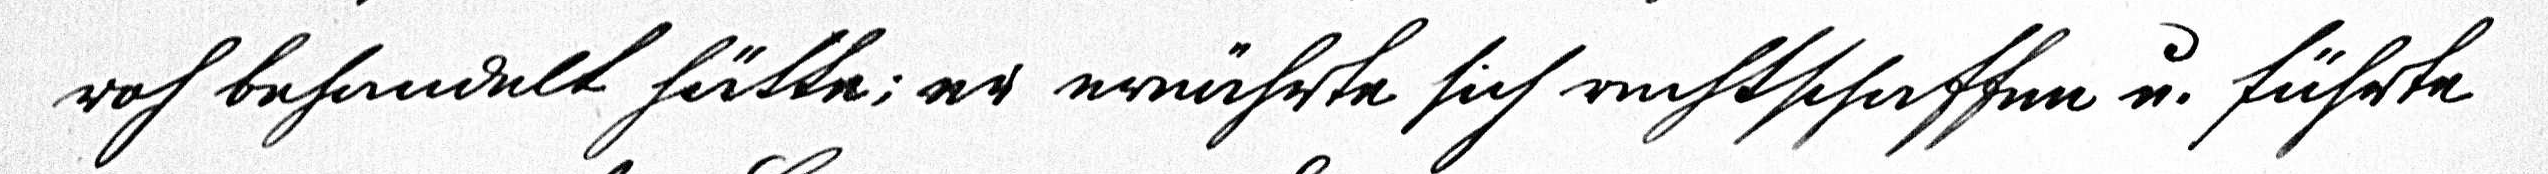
roh behandelt hätte; er ermühete sich rechtschaffen u. führte
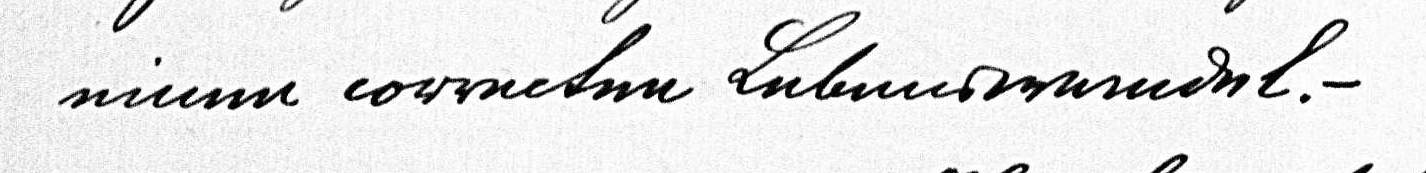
einen correcten Lebenswandel.–
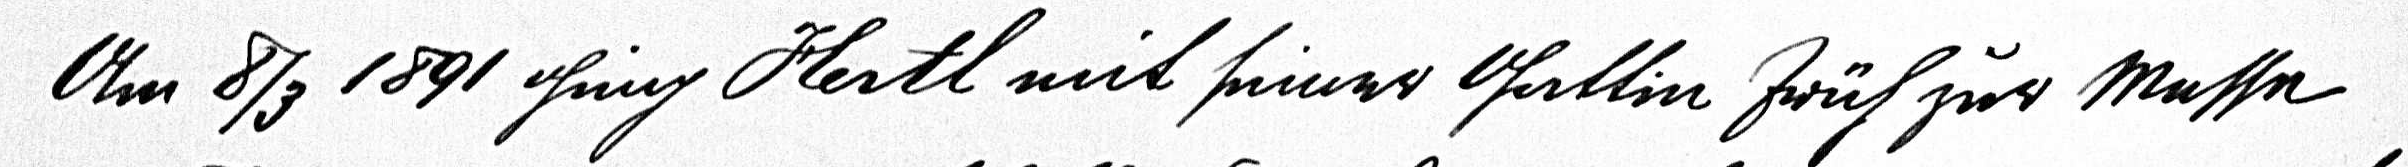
Am 8/3 1891 ging Hertl mit seiner Gattin früh zur Messe
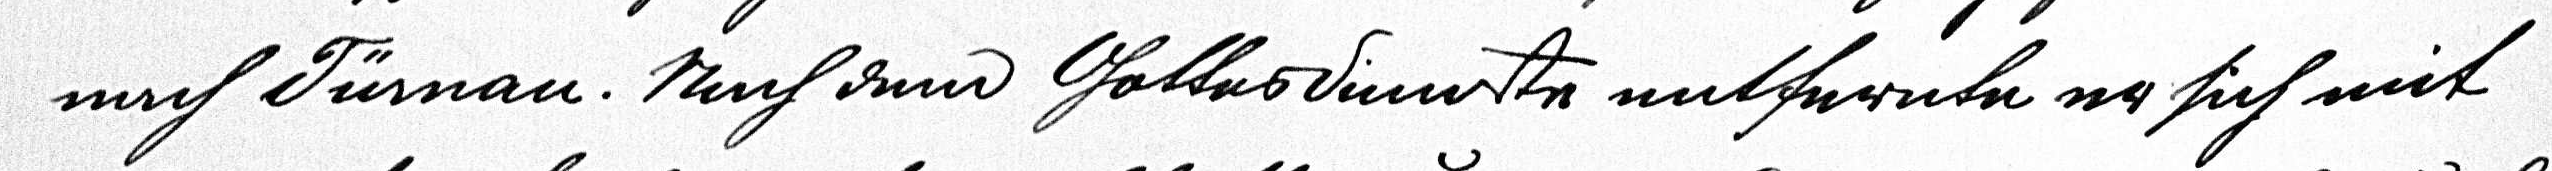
nach Türnau. Nach dem Gottesdienste entfernte er sich mit
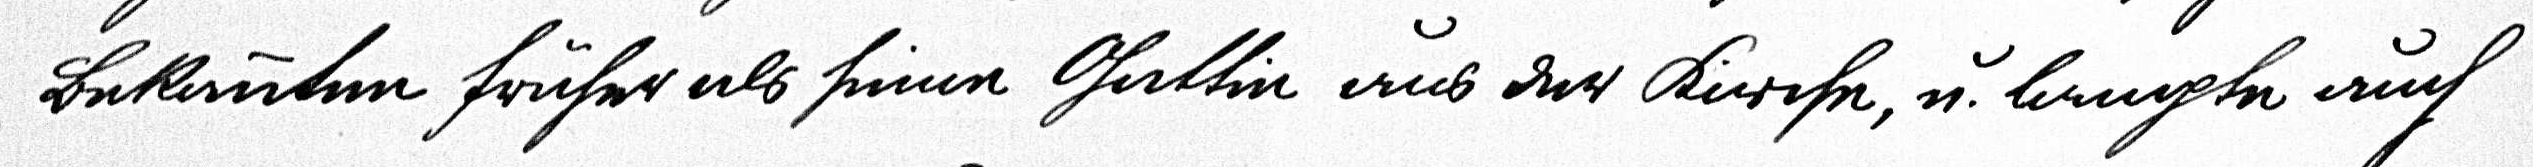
Bekannten früher als seine Gattin aus der Kirche, u langte auch
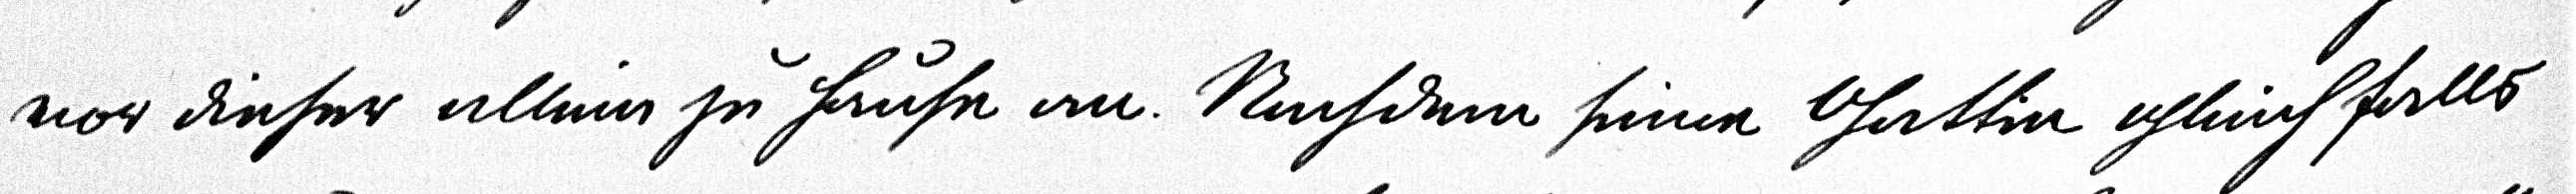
vor dieser allein zu Hause an. Nachdem seine Gattin gleichfalls
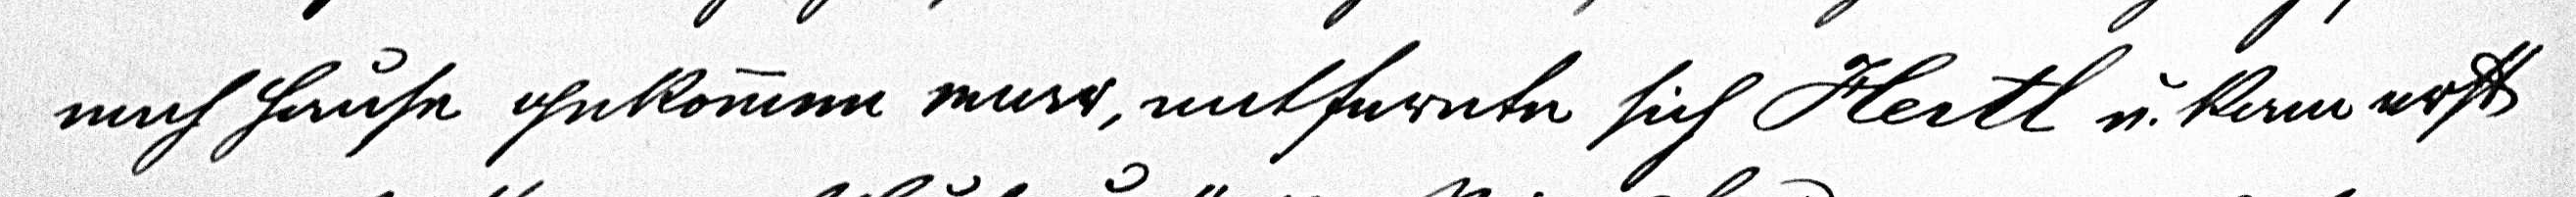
nach Hause gekommen war, entfernte sich Hertl u. kam erst
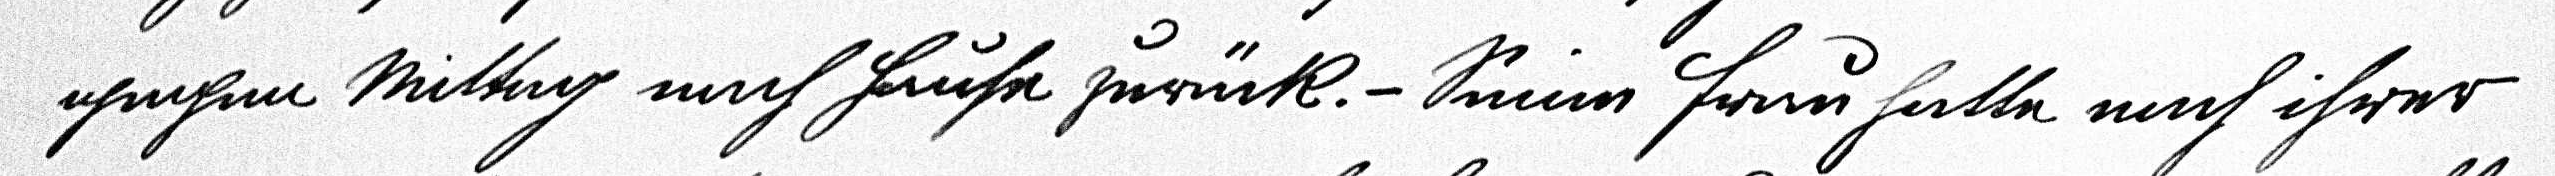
gegen Mittag nach Hause zurück. Seine Frau hatte nach ihrer
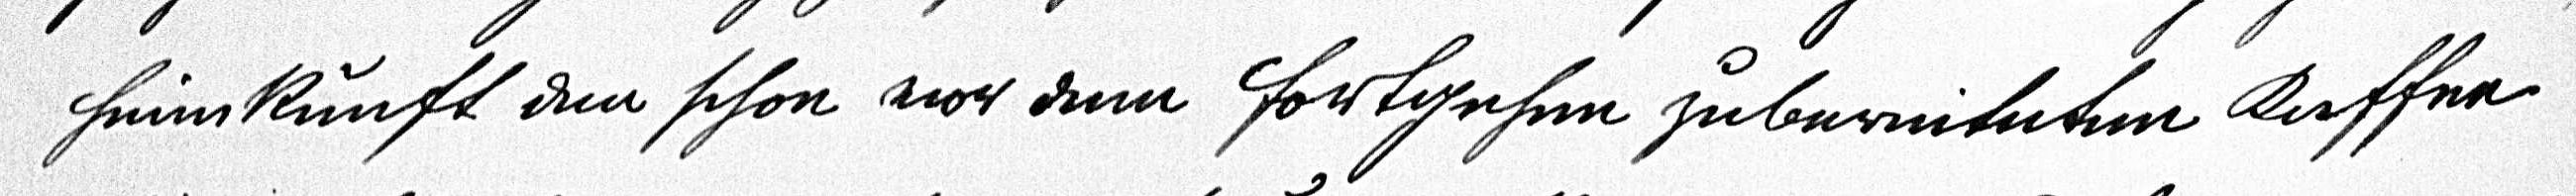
Heimkunft dem schon vor dem Fortgehen zubereiteten Kaffee
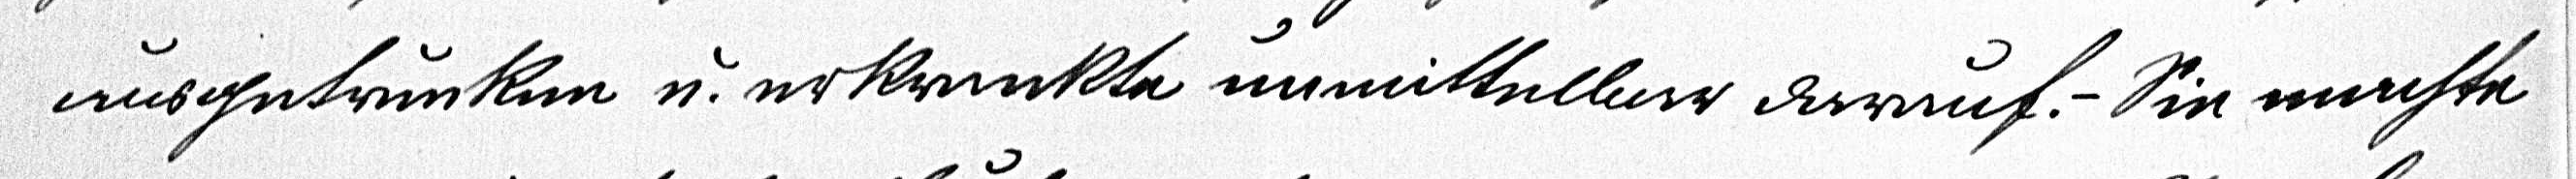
ausgetrunken u. erkrankte unmittelbar darauf. Sie machte
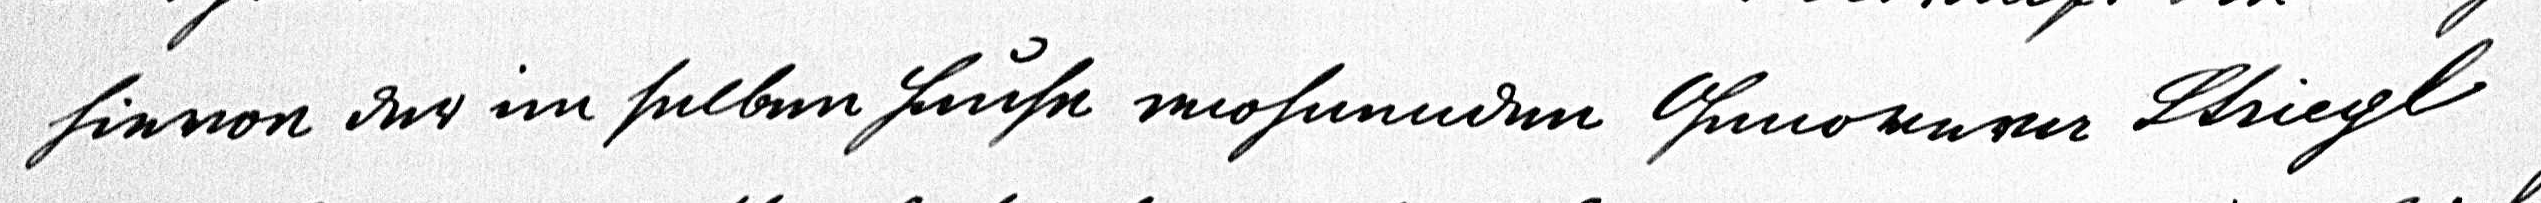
hievon der im selben Hause wohnenden Genoveva Striegl
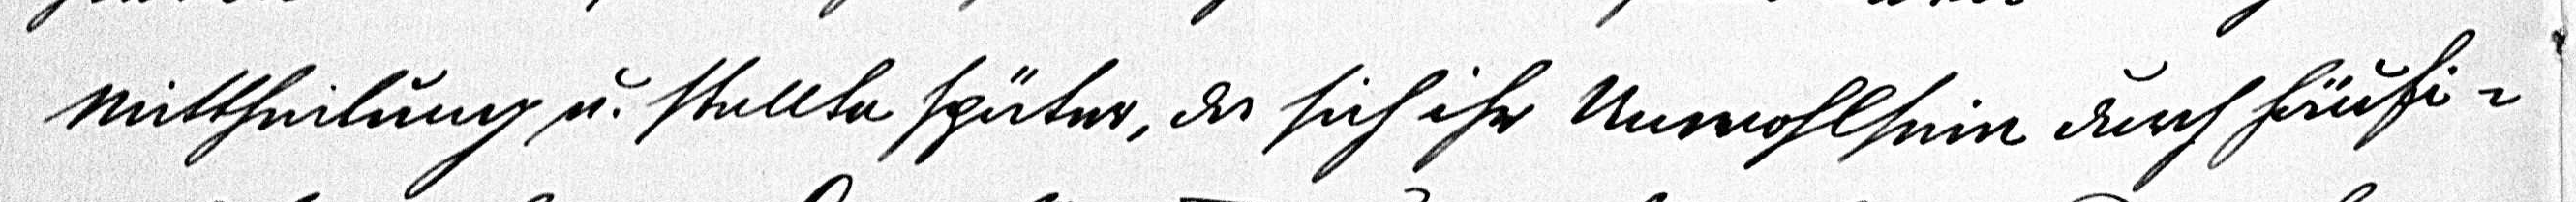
Mittheilung u. stellte später, da sich ihr Unwollsein durch häufi¬
